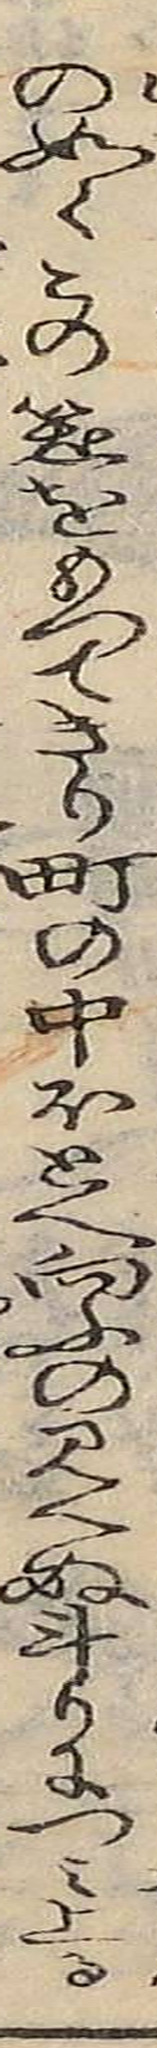の如くこの筐をもつてきり町の中ほとへ向ふの見へぬ計りにつみ上る
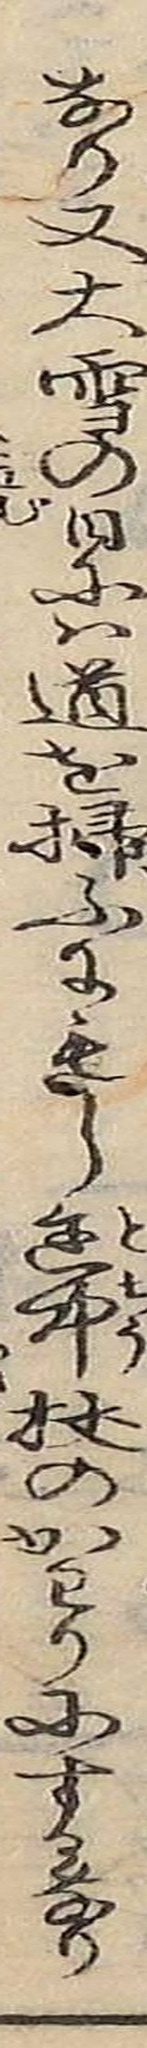なり又大雪の日には道を掃ふにもし途中杖のかわりにするなり
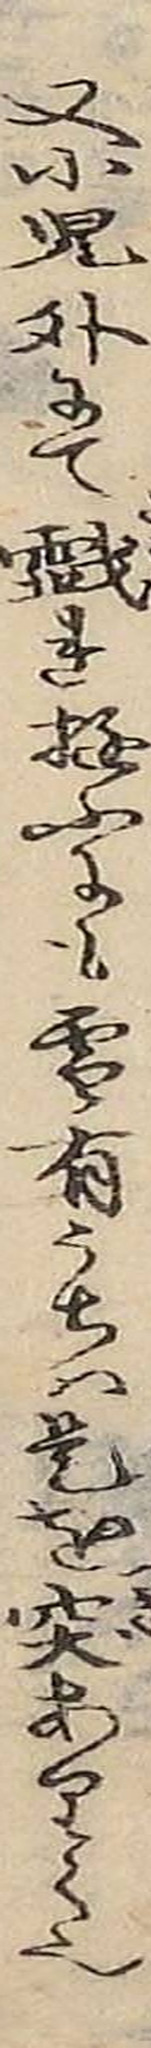又小児外にて戯れ遊ふにも雪有うちは是を突ありく也
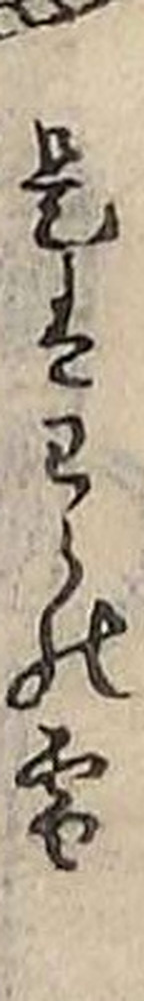是はわらの雪
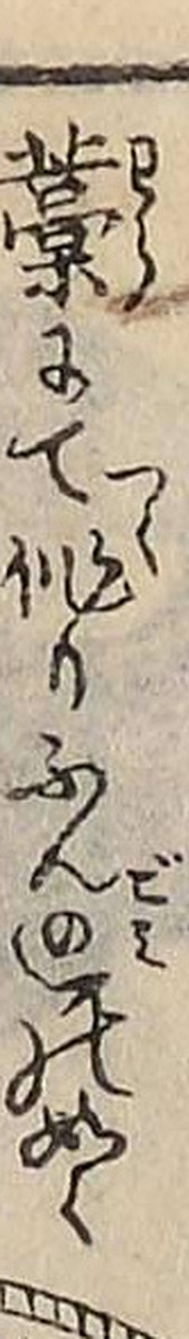藁にて作りふん込の如く
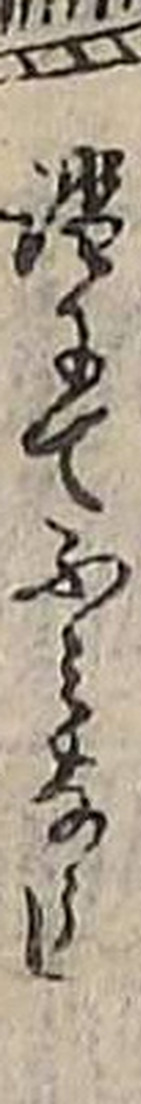踏にてふみならし
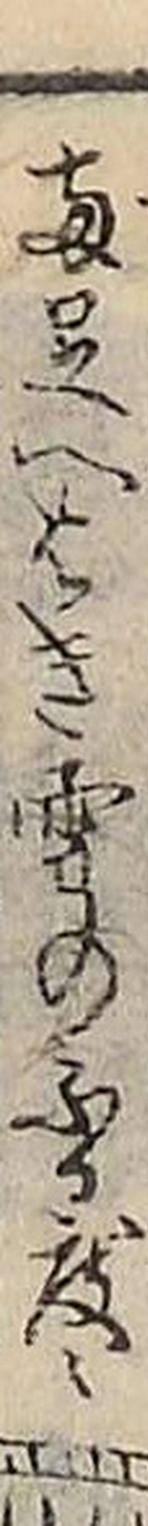両足へはき雪のふる度々
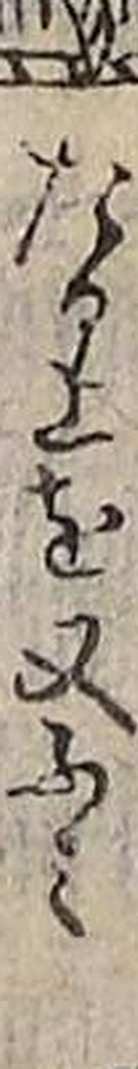たるり上を又ふみ
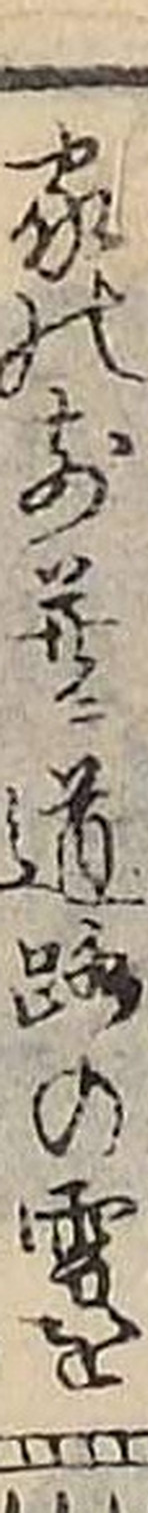家の前並道路の雪を
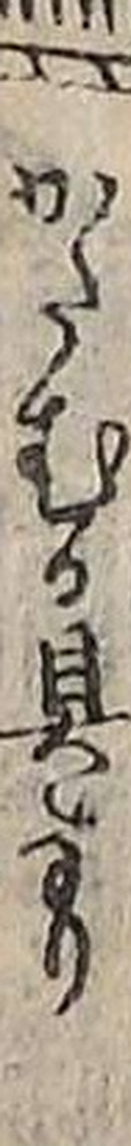かたむる具なり
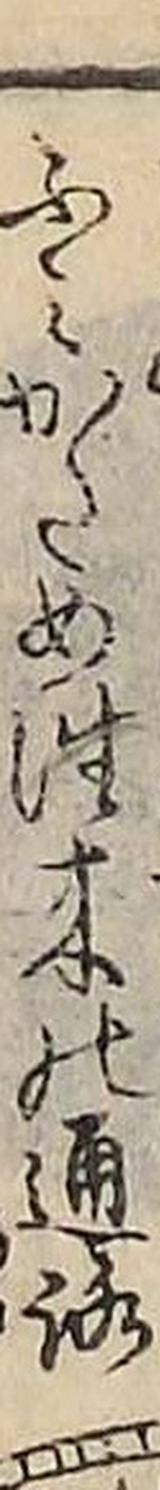ふみかためつ往来の通路
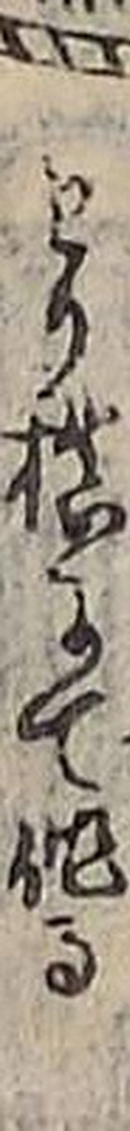わり槙にて作る
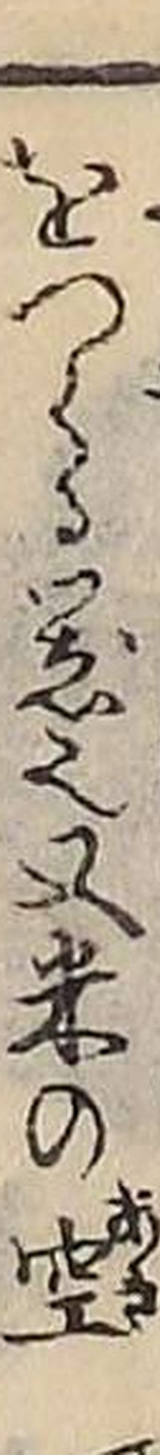をつくる器也又米の空
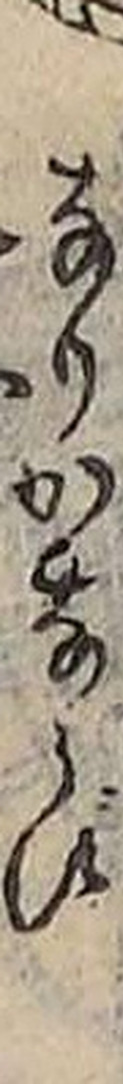なりかならず
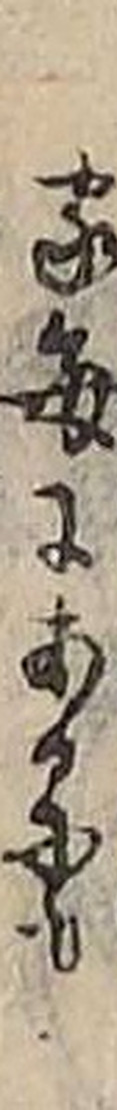家毎にあるにも
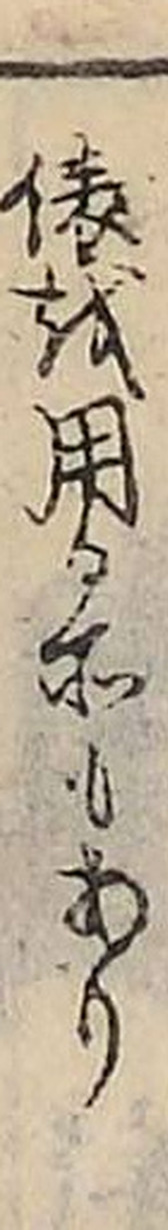俵を用る所もあり
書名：旅行用心集
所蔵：神戸大学附属図書館 国文学研究資料館
